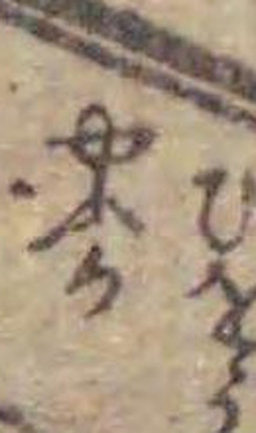やふか
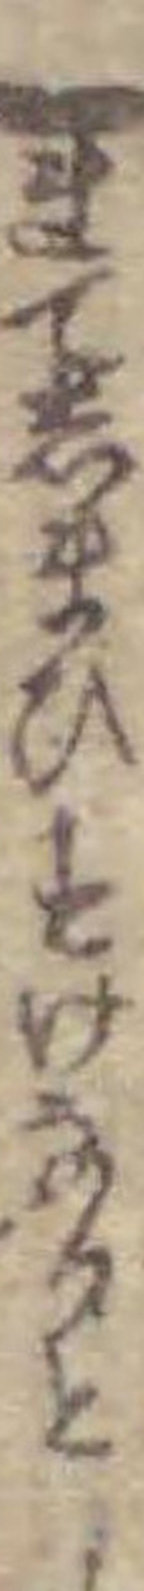れてしまひすけなりと
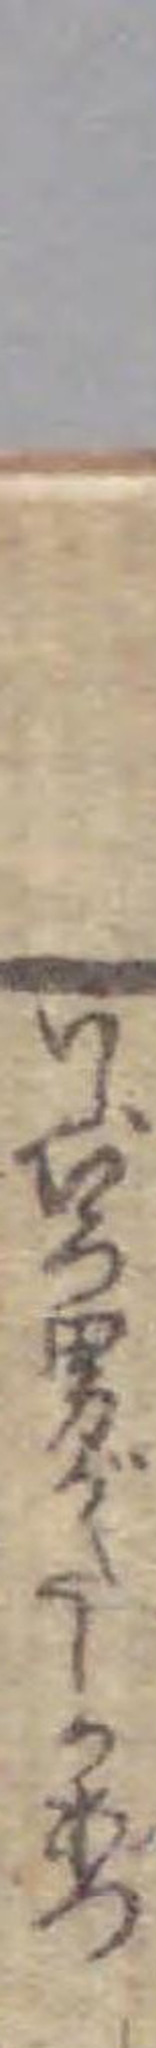いふいろ男がたしかあつ
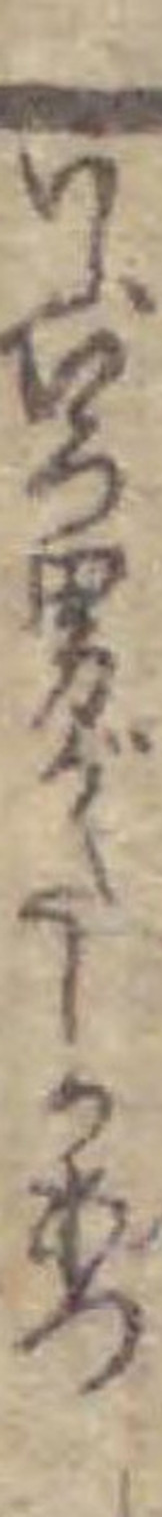いふいろ男がたしかあつ
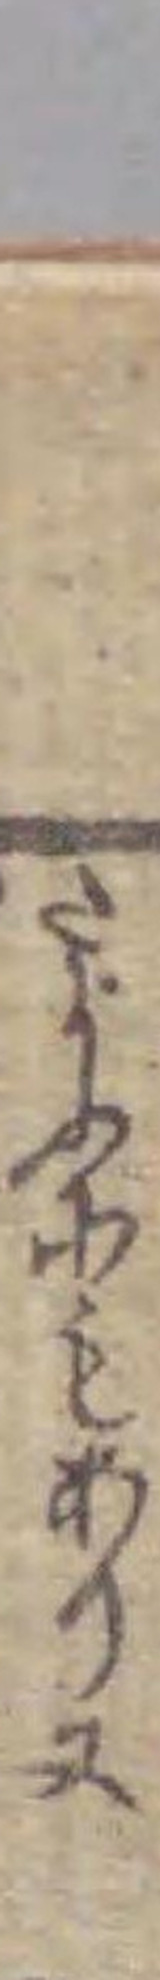たよふにもあり又
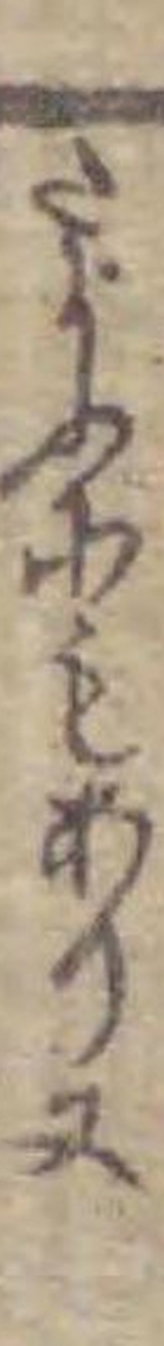たよふにもあり又
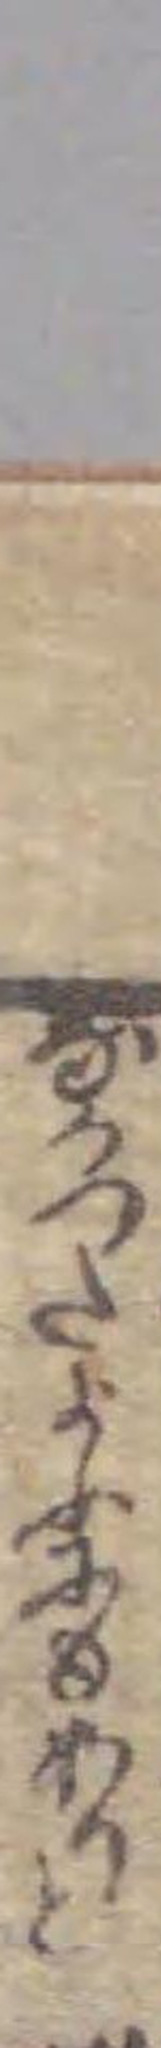なかつたよふにもありと
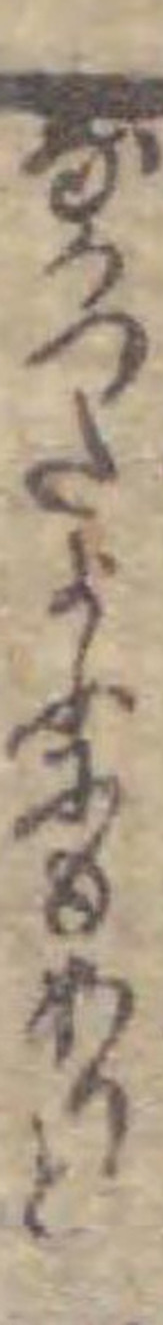なかつたよふにもありと
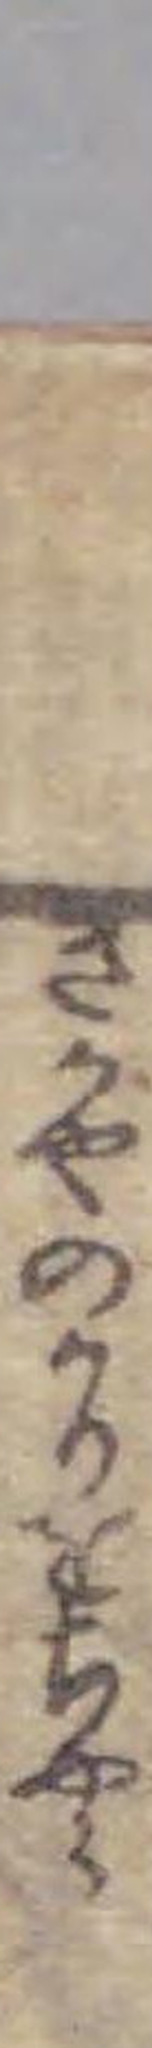さかやのかりをちやら
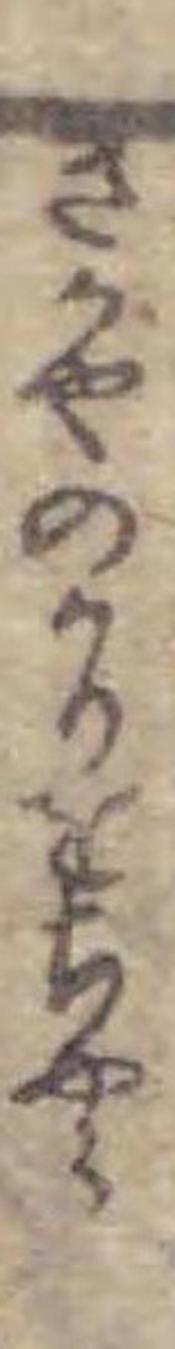さかやのかりをちやら
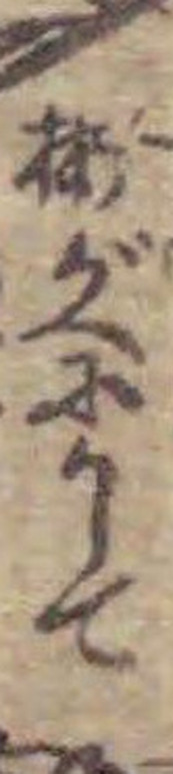梅がへにかして
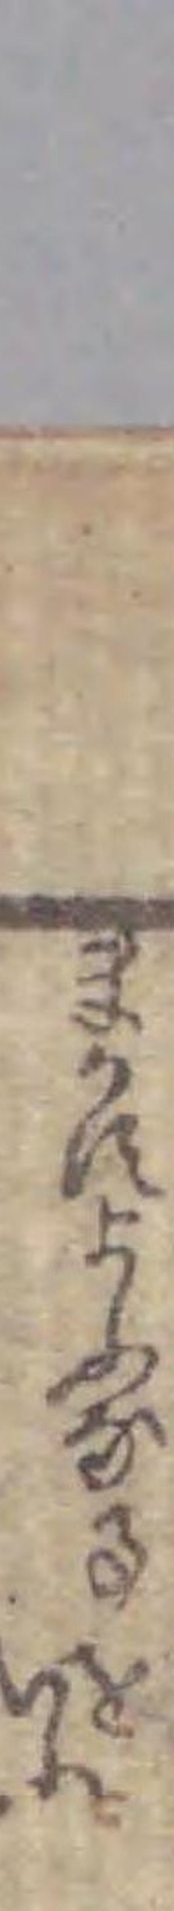まかすよふな事を
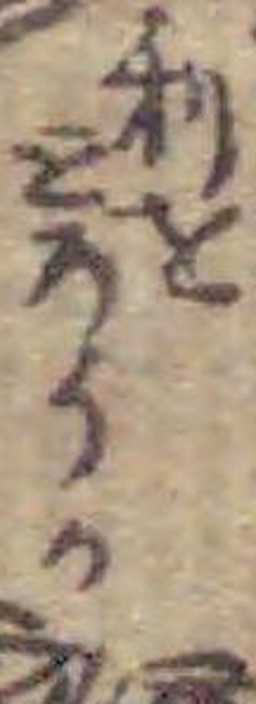とろうか
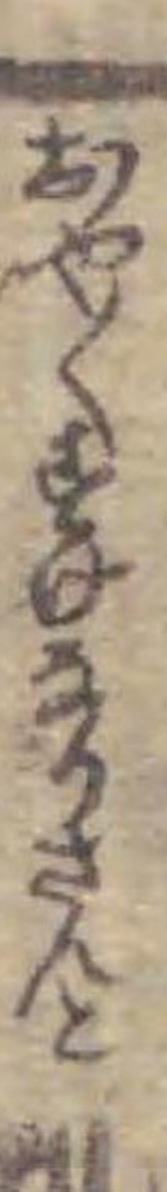おや〳〵すけなりさんと
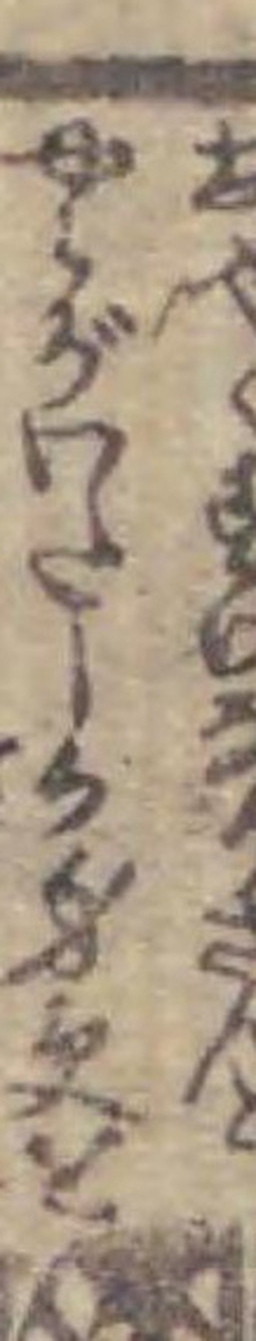やらがわたしか身受を
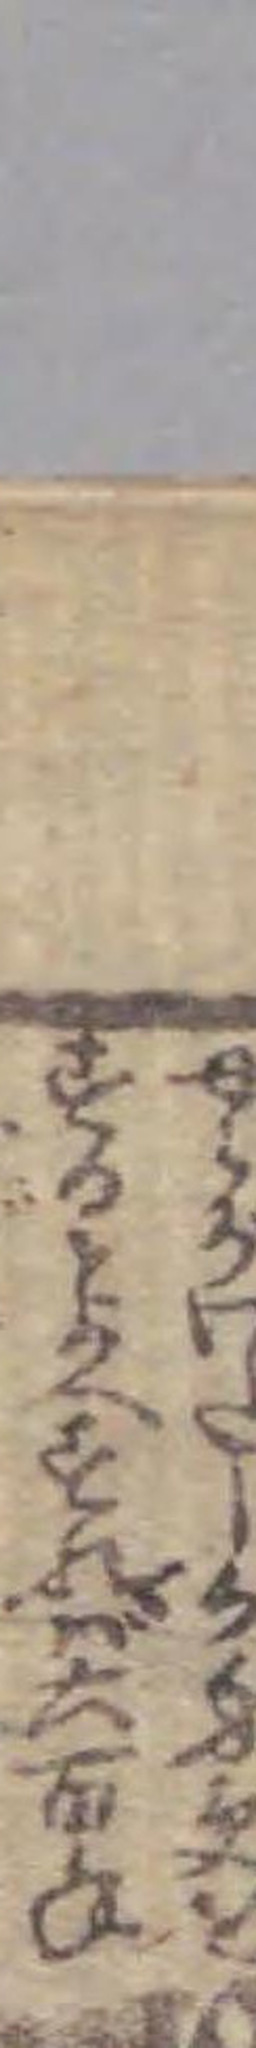するとかへすれば六百年
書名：年寄之冷水曽我 : 3巻
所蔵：国立国会図書館 National Diet Library, JAPAN
